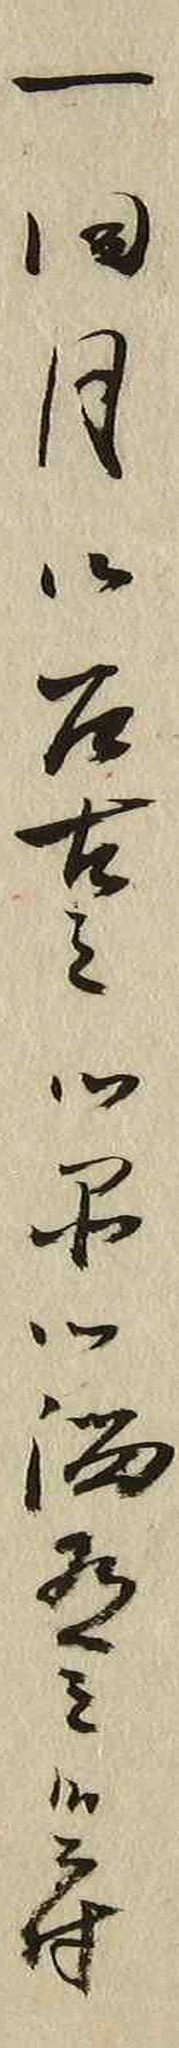一同月御召古之御品御溜有之候ニ付
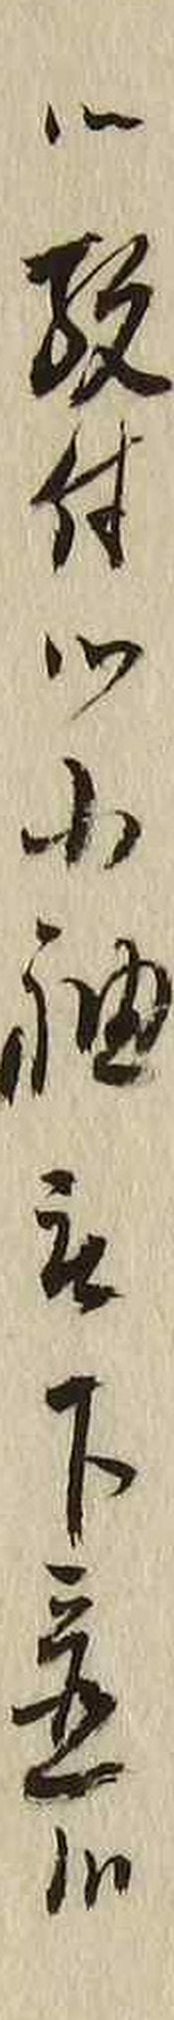御紋付御小袖被下置候
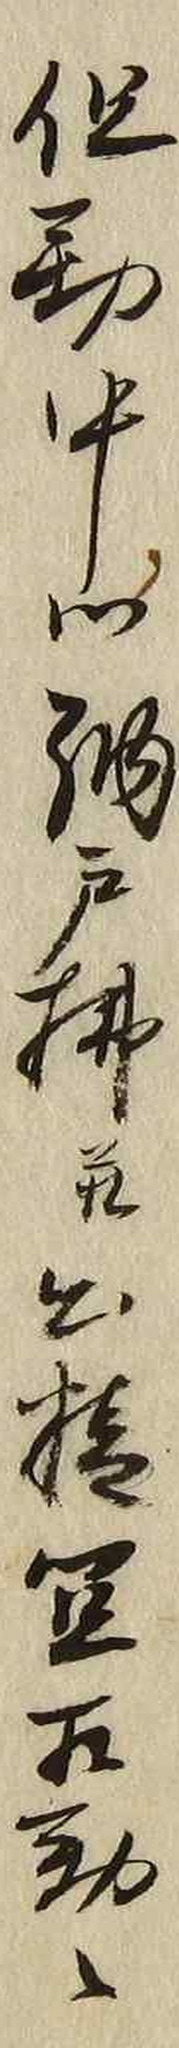但勤中御納戸払并出精宜相勤候
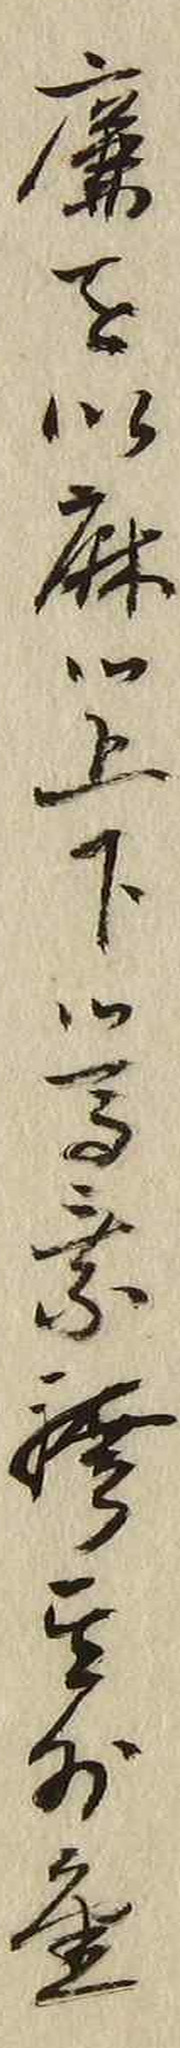廉を以麻御上下御馬乗袴其外金
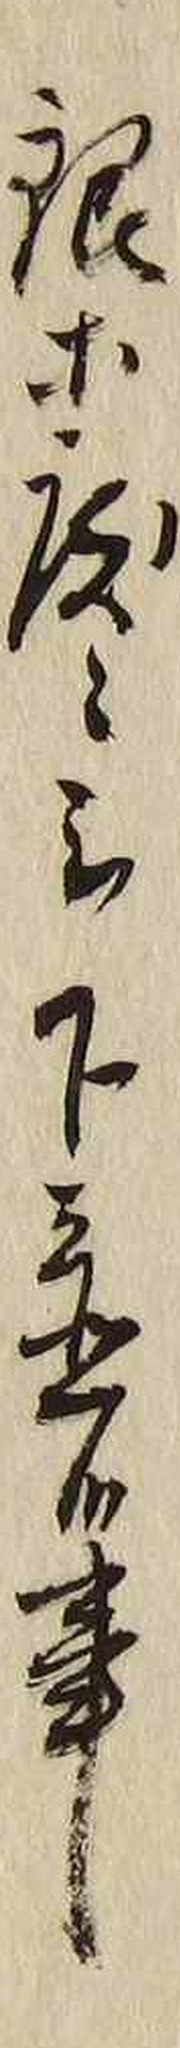銀等度々被下置候事
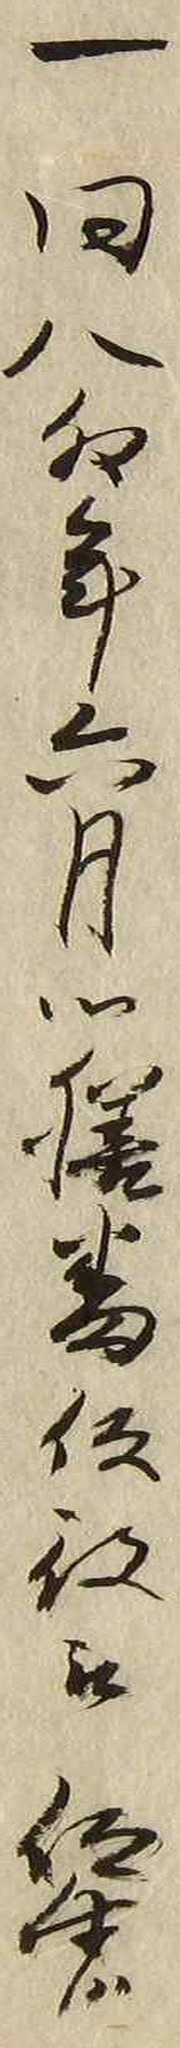一同八卯年六月御膳番仮役被仰付候
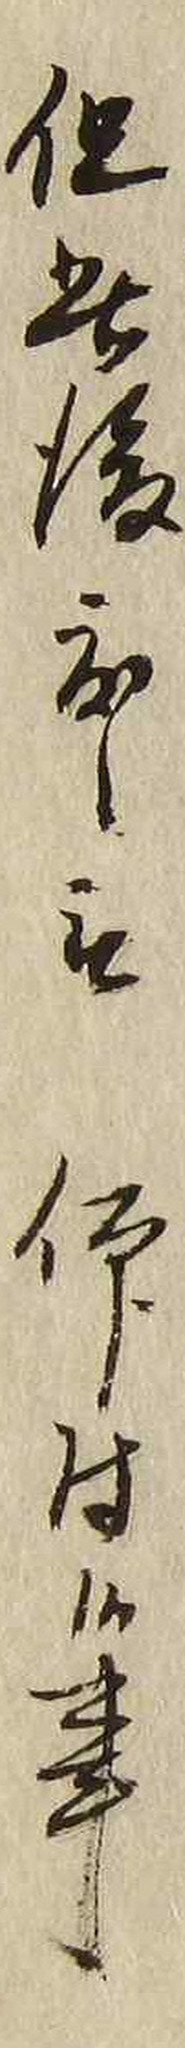但此後度々被仰付候事

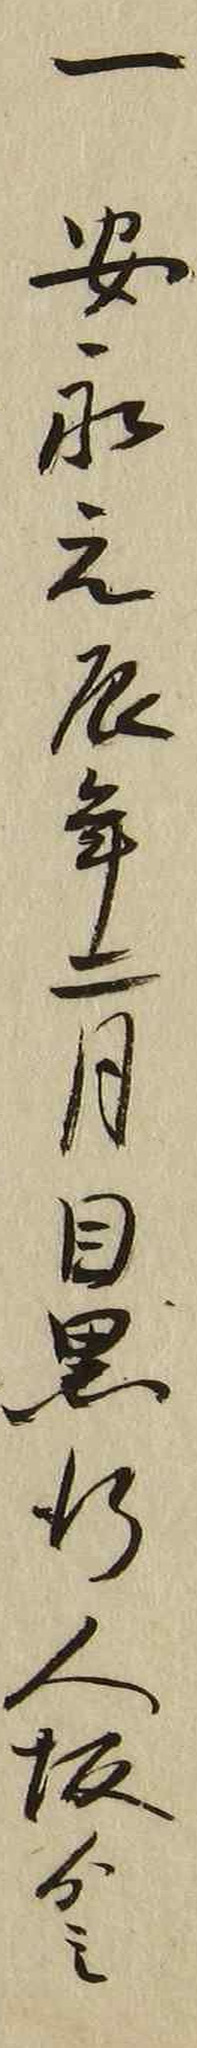一安永元辰年二月目黒行人坂ゟ之
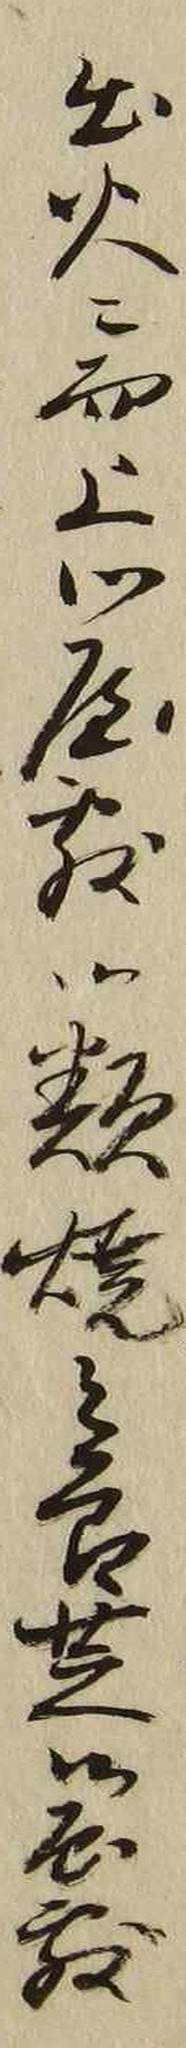出火ニ而上御屋敷御類焼之節芝御屋敷
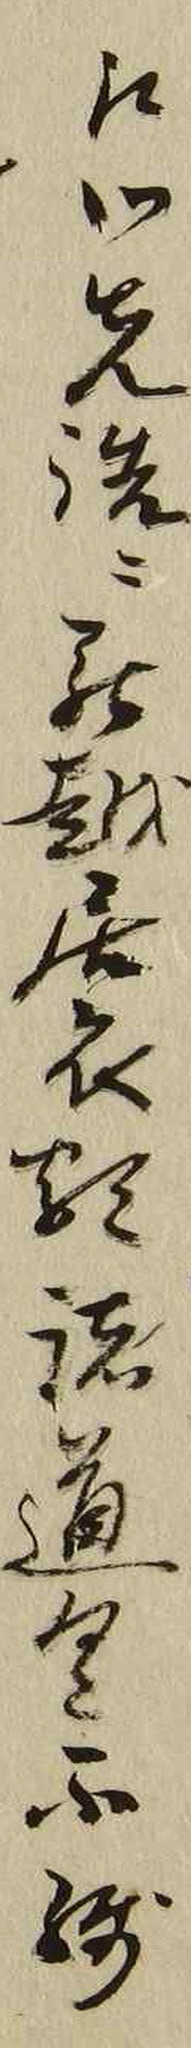江御先詰ニ罷越居衣類諸道具不残
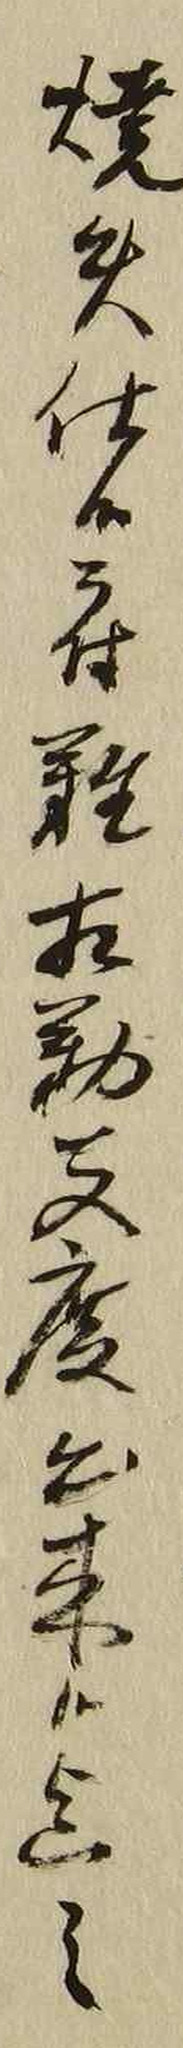焼失仕候ニ付難相勤支度出来候迄之
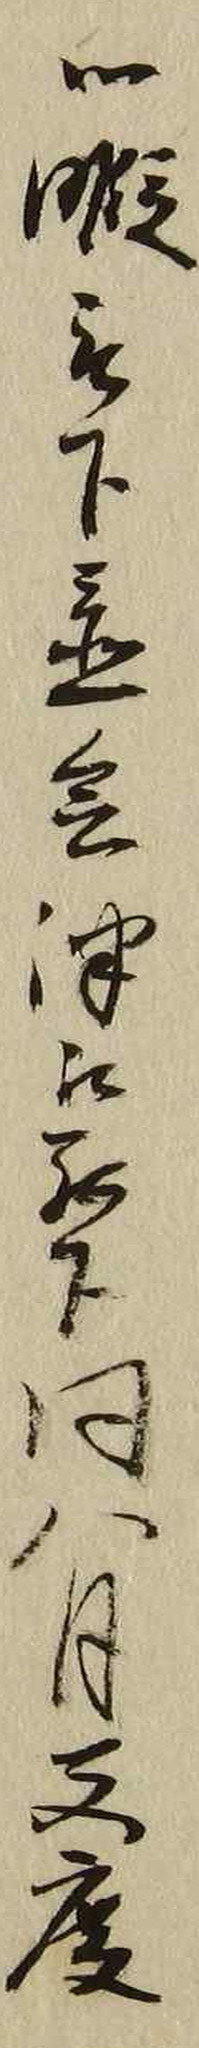御暇被下置会津江罷下同八月支度
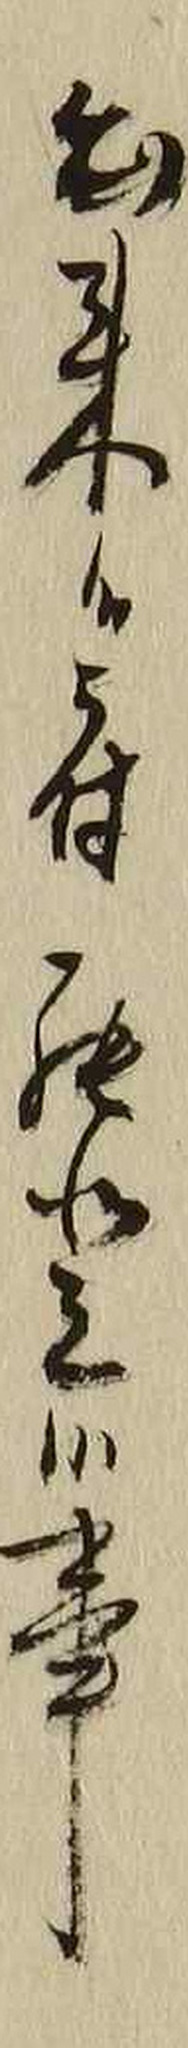出来候ニ付罷登候事
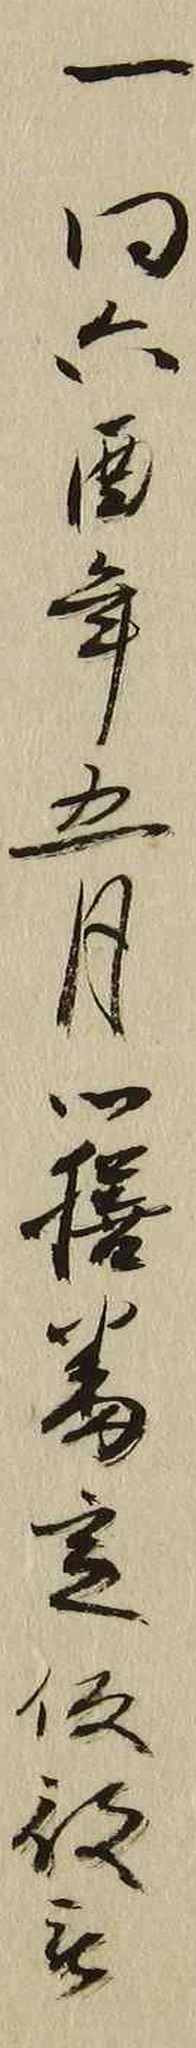一同六酉年五月御膳番定仮役被
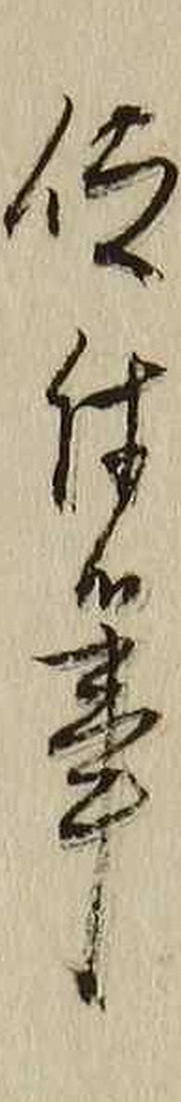仰付候事
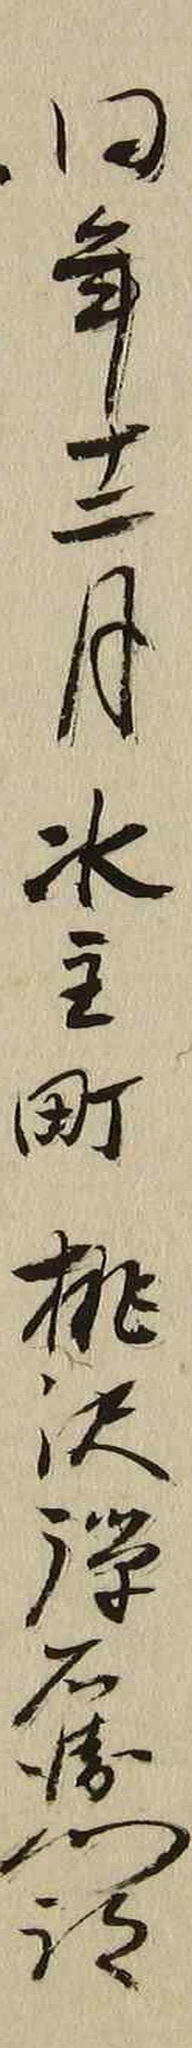一同年十二月水主町桃沢弾右衛門跡
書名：諸士系譜　巻之345　も之部1
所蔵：会津若松市立会津図書館
